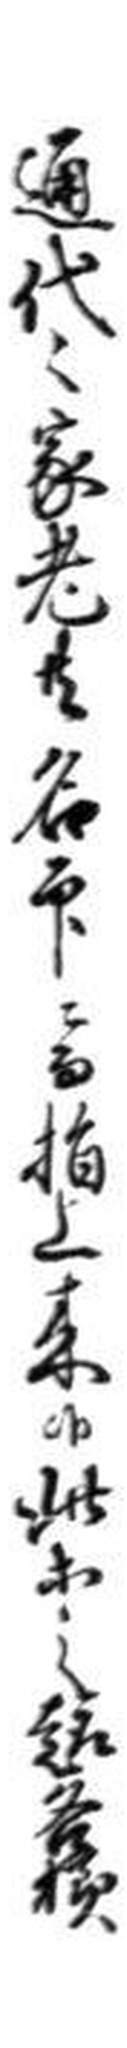通代々家老共名印ニ而指上来候此等之趣各様
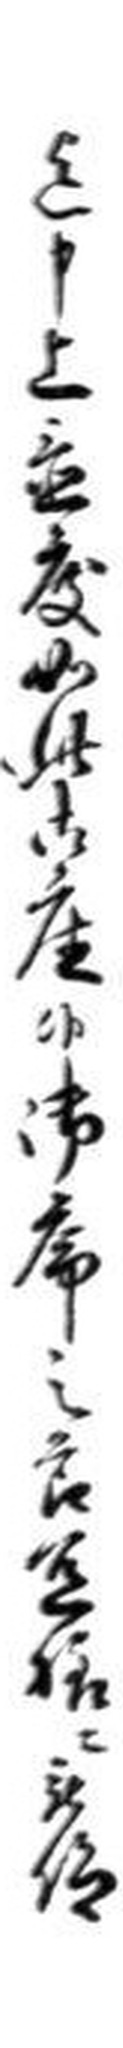迄申上置度如此御座候御席之節宜様ニ被仰
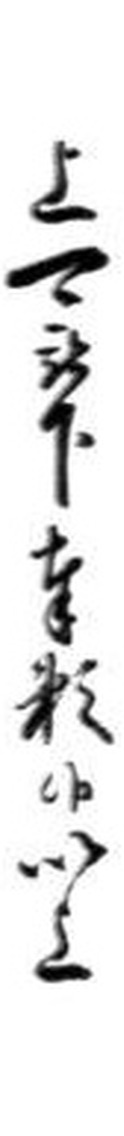上可被下奉頼候以上
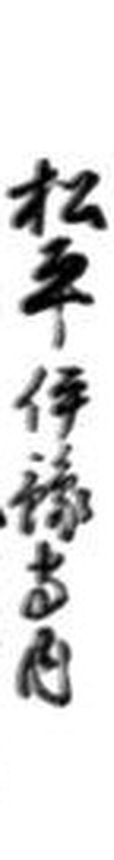松平伊予守内
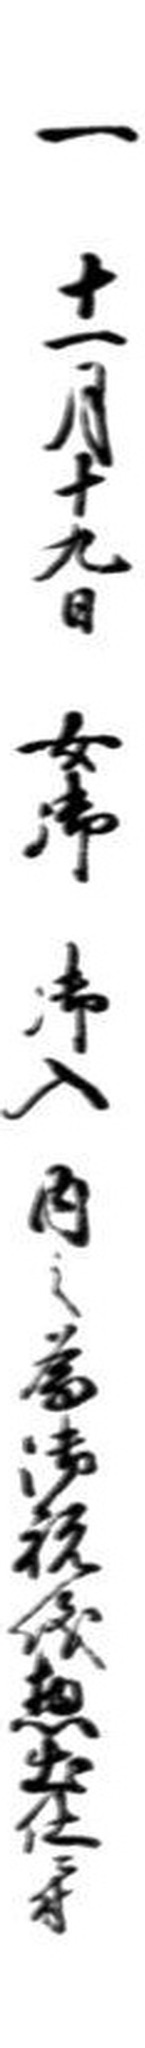一十一月十九日女御御入内之為御祝儀惣出仕ニ付
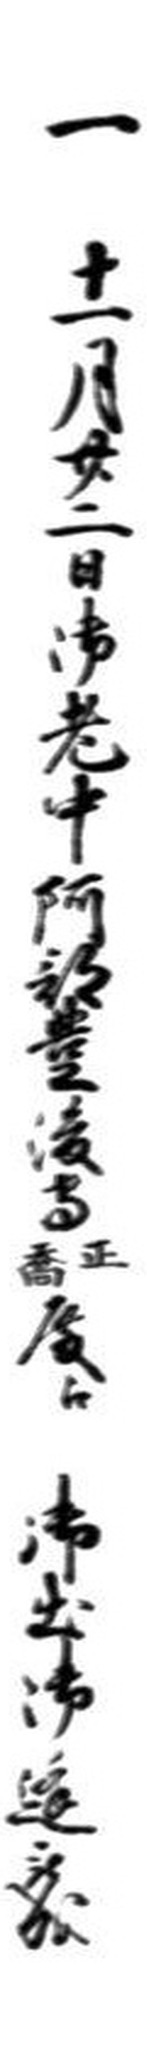一十一月廿二日御老中阿部豊後守正喬殿江御出御逢対被成
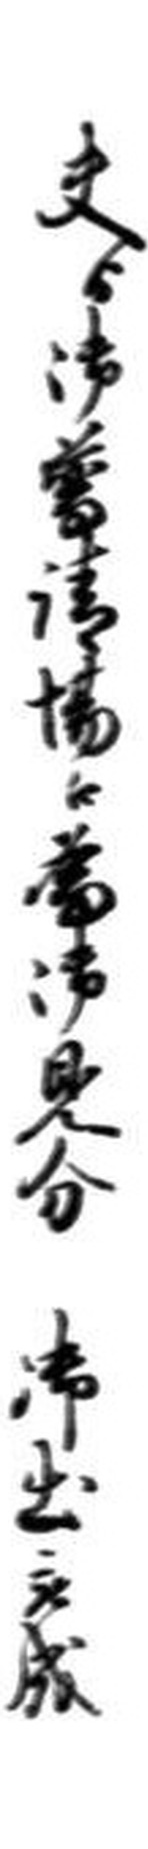夫ゟ御普請場江為御見分御出被成
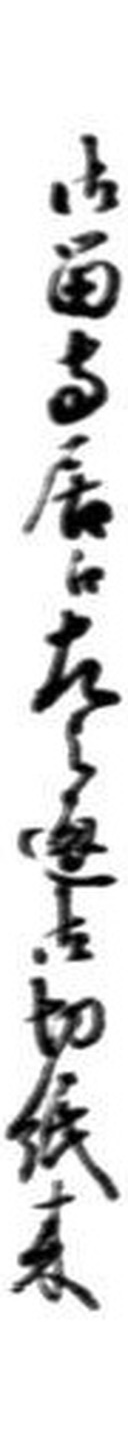御留守居江左之通御切紙来
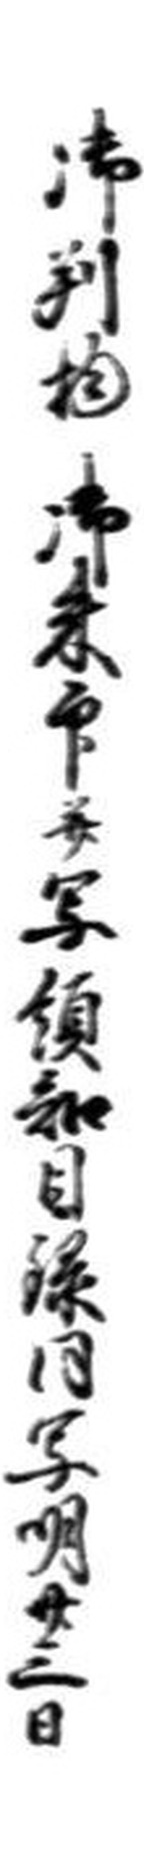御判物御朱印并写領知目録同写明廿三日

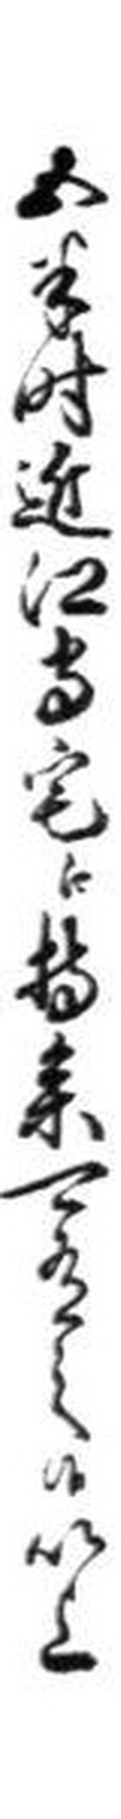五半時近江守宅江持参可有之候以上
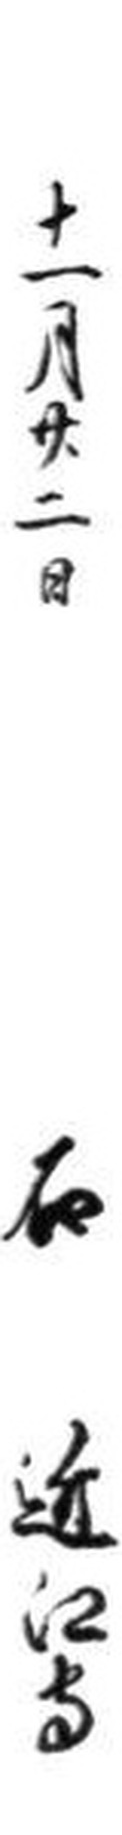十一月廿二日石近江守
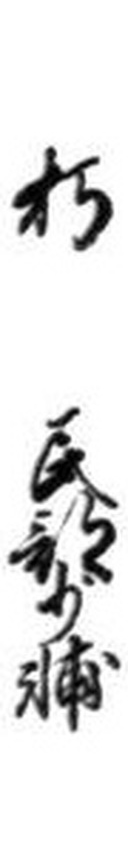朽民部少輔
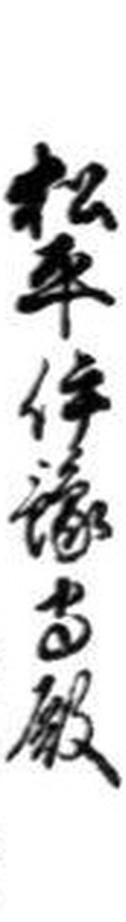松平伊予守殿
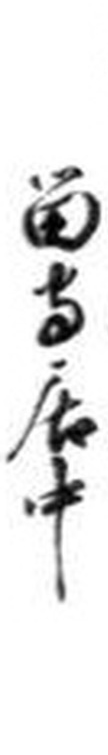留守居中
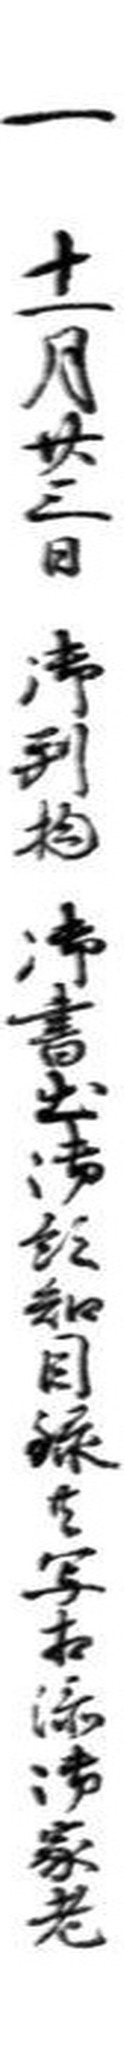一十一月廿三日御判物御書出御領知目録共写相添御家老
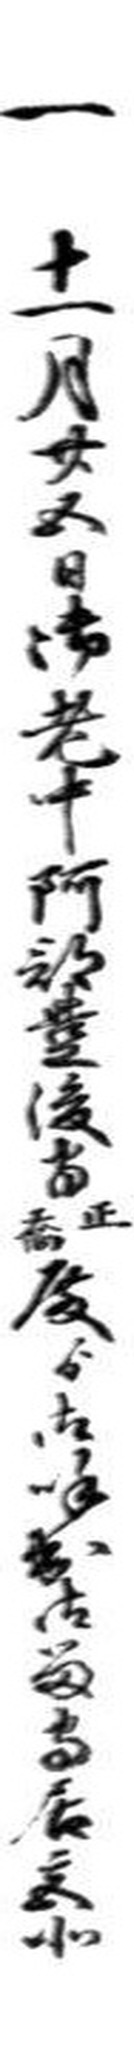一十一月廿五日御老中阿部豊後守正喬殿ゟ御呼出御留守居宮北
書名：家譜 三十一 吉邦公 享保元年
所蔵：福井県文書館 Fukui Prefectural Archives
